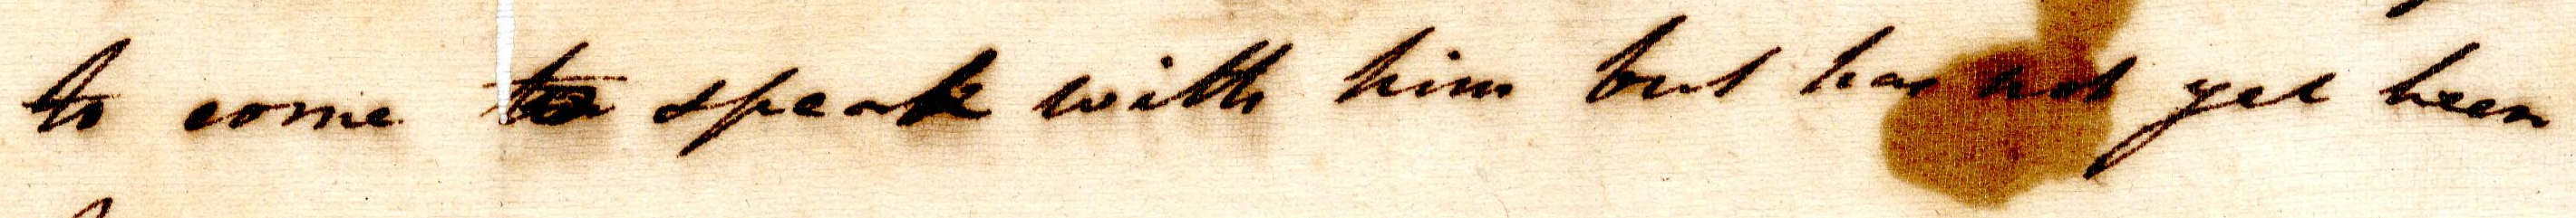to come to speak with him but have not yet been
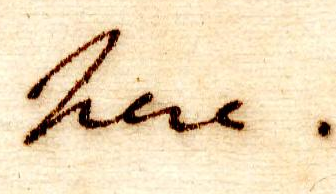here.
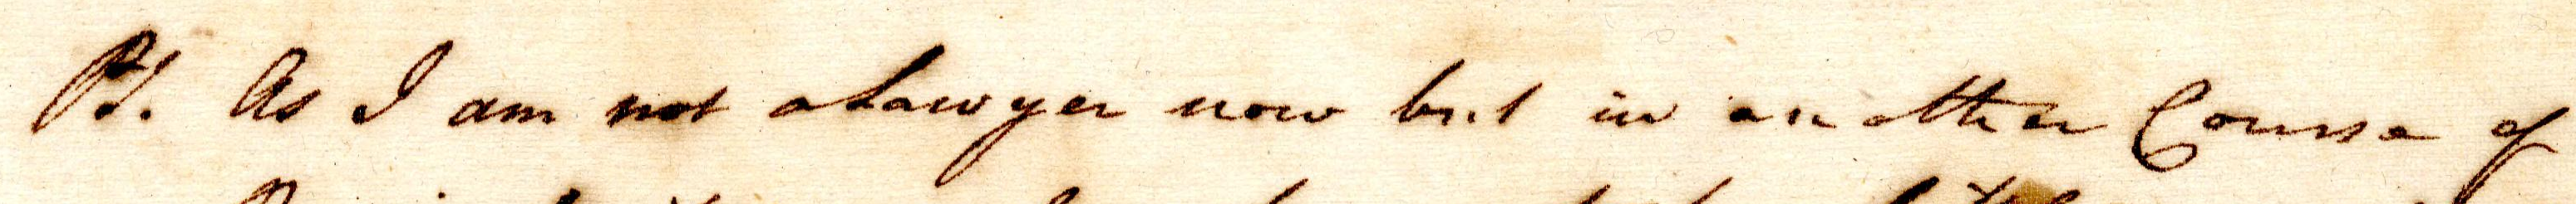PS. As I am not a Lawyer now but in another Course of
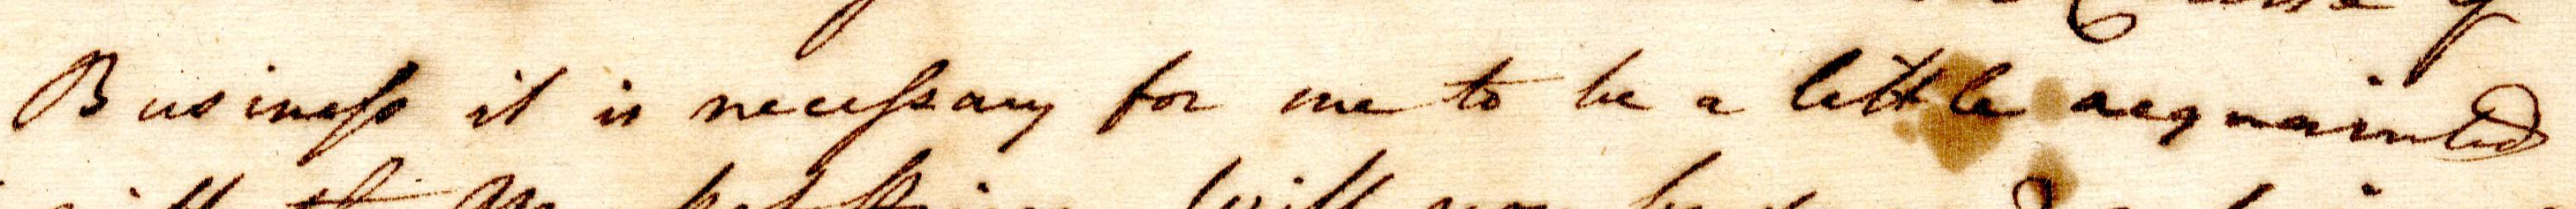Business it is necessary for me to be a little acquainted
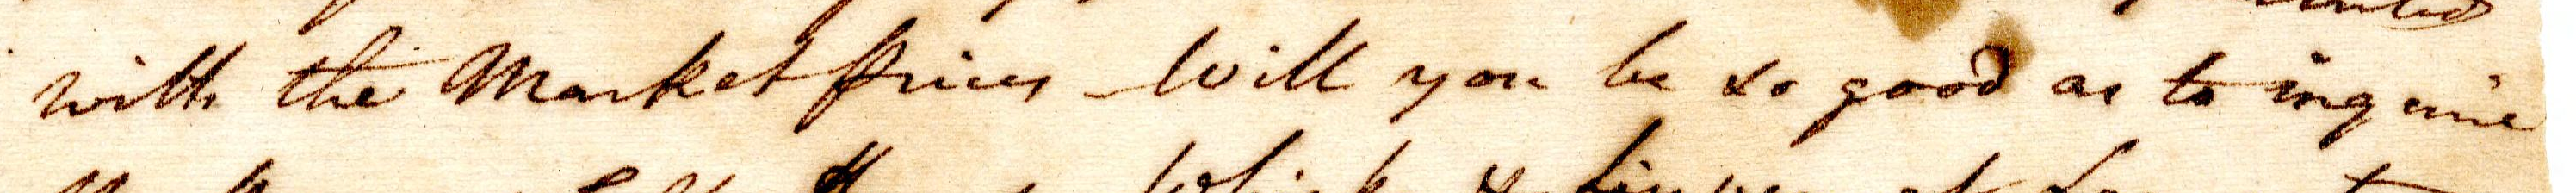with the Market Prices- Will you be so good as to inquire
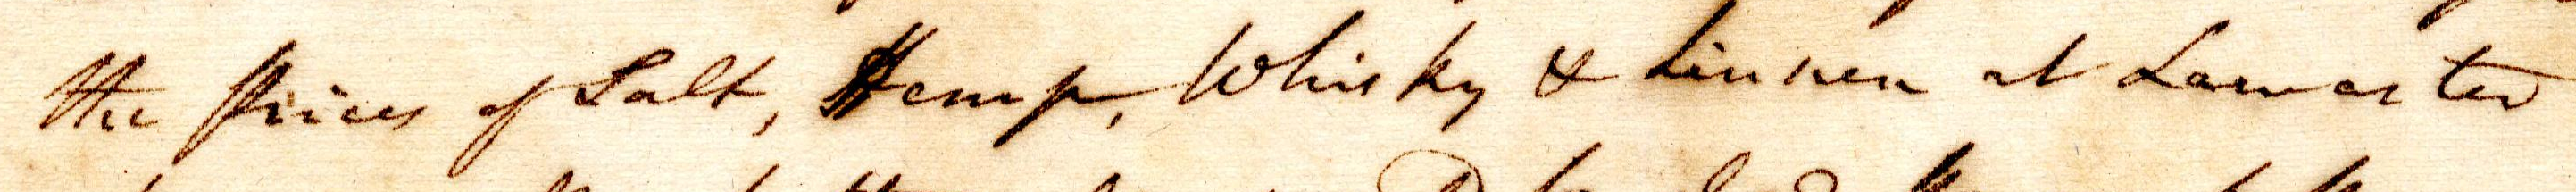the Prices of Salt, Hemp, Whisky & Linnen at Lancaster
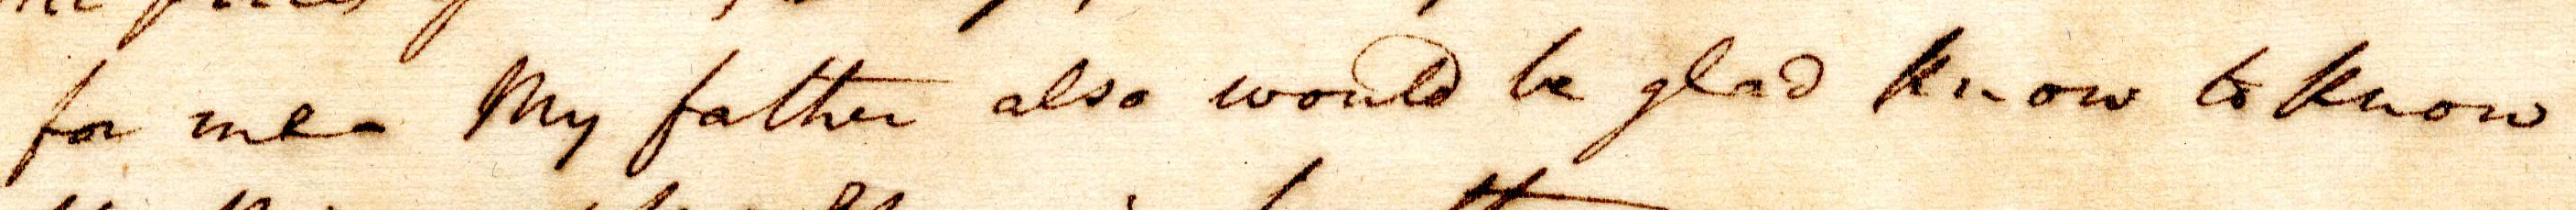for me. My father also would be glad know to know
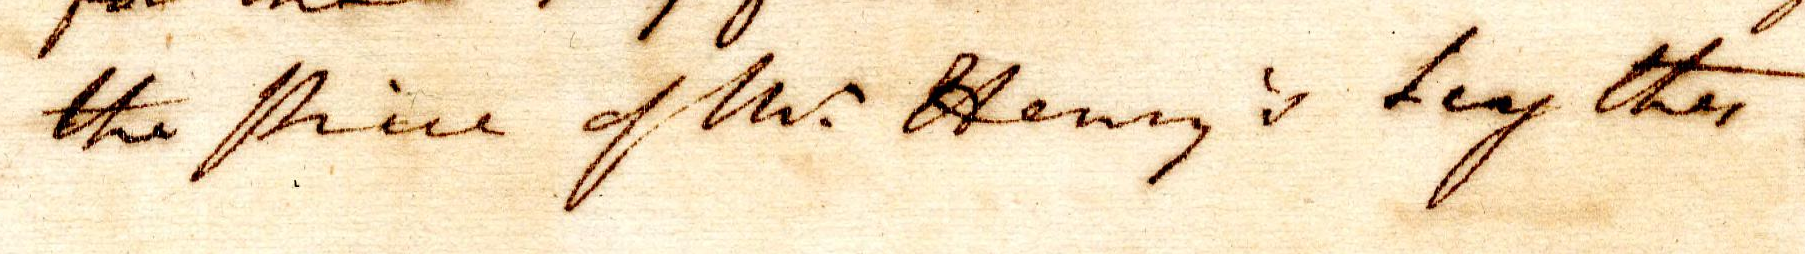the Price of M^r. Henry's Leyther
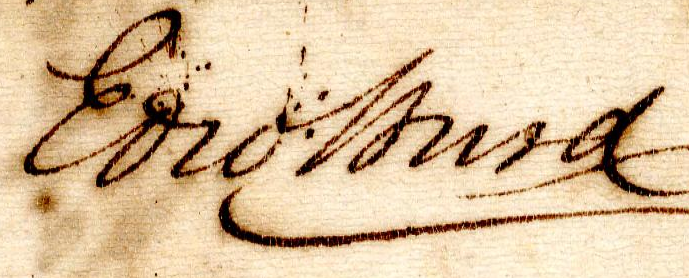Edw: Burd
